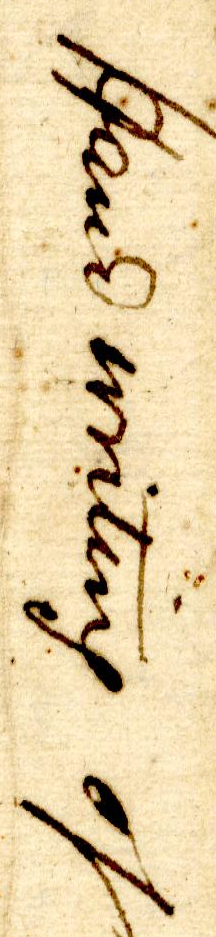Hand writing of
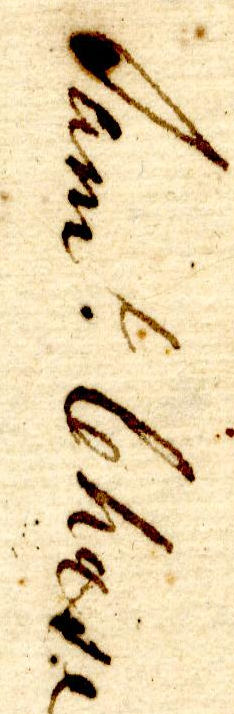Sam^l. Chase
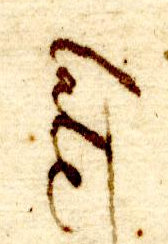late
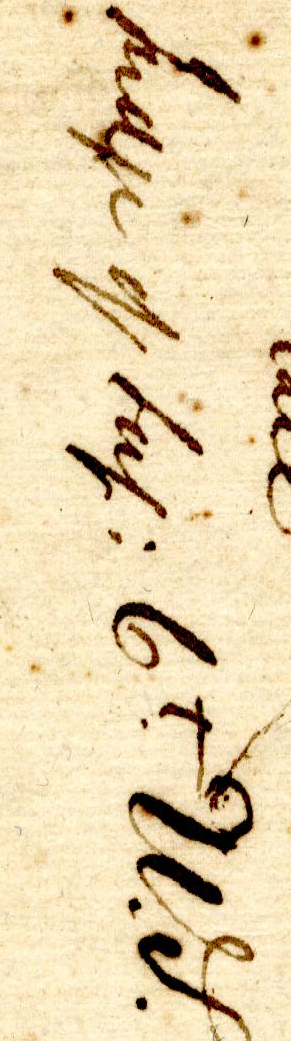hape of saf: 6^t. W.S.
